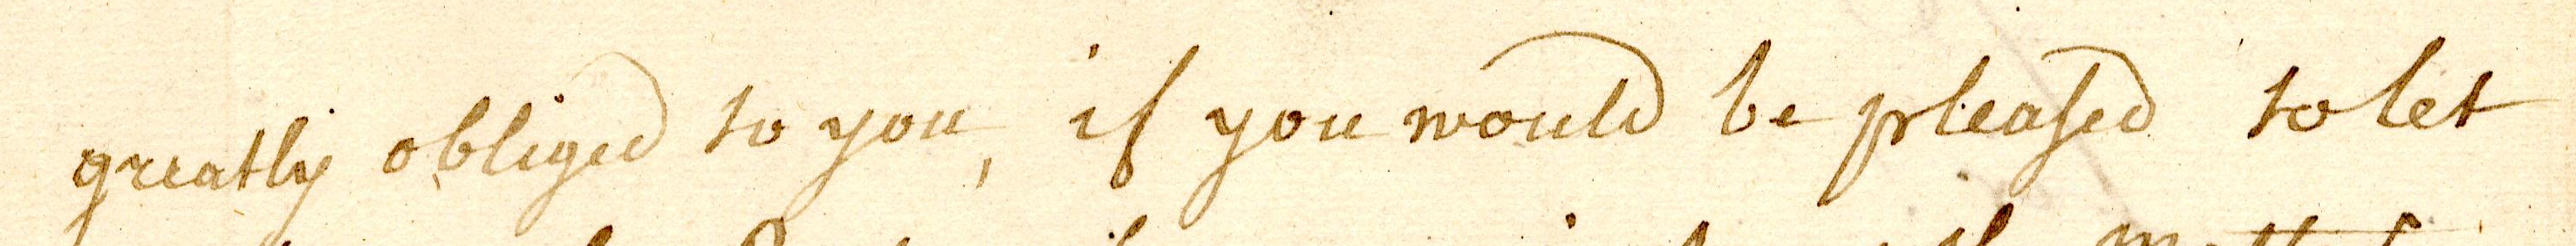greatly obliged to you, if you would be pleased to let
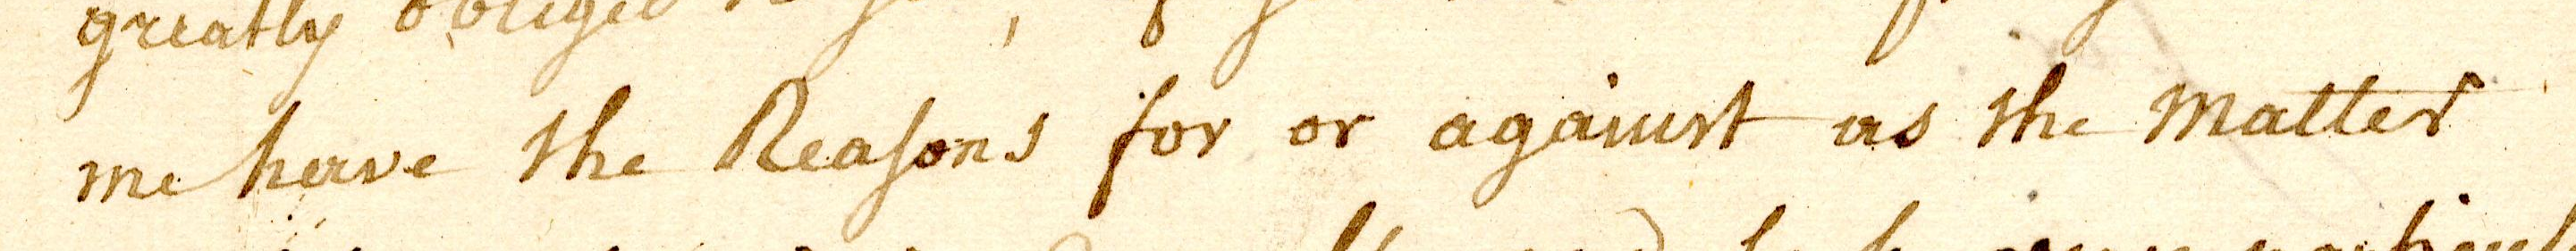me have the Reasons for or against as the Matter
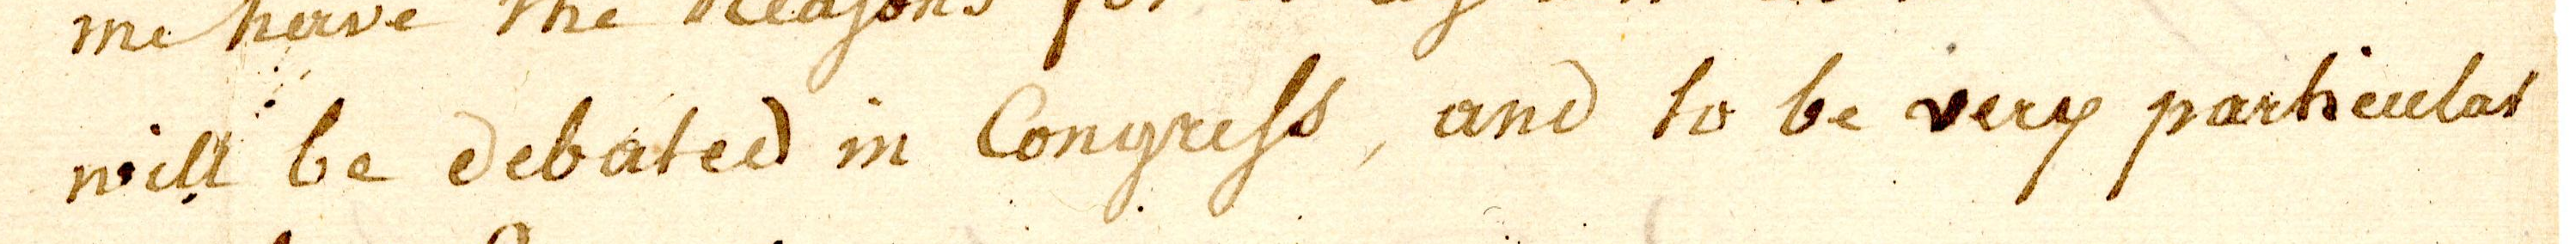will be debated in Congress, and to be very particular
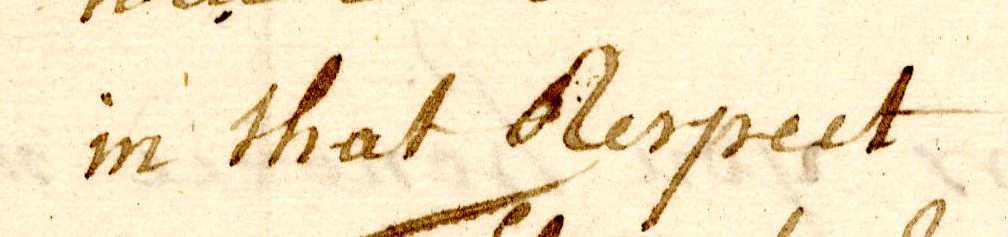in that Respect
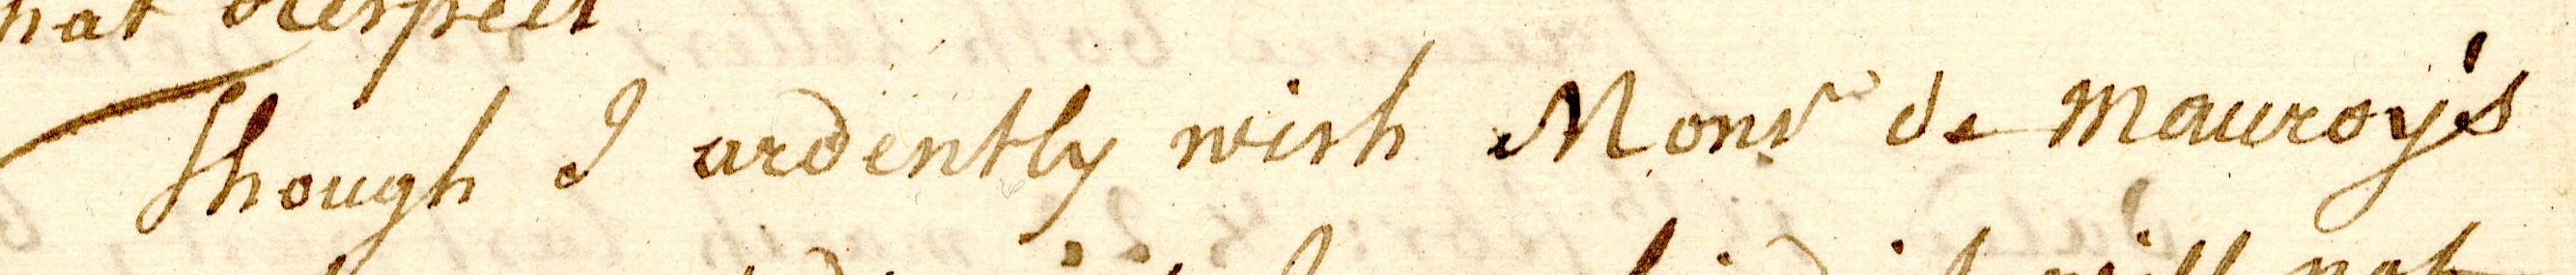Though I ardently wish Mons^r de Mouroy's
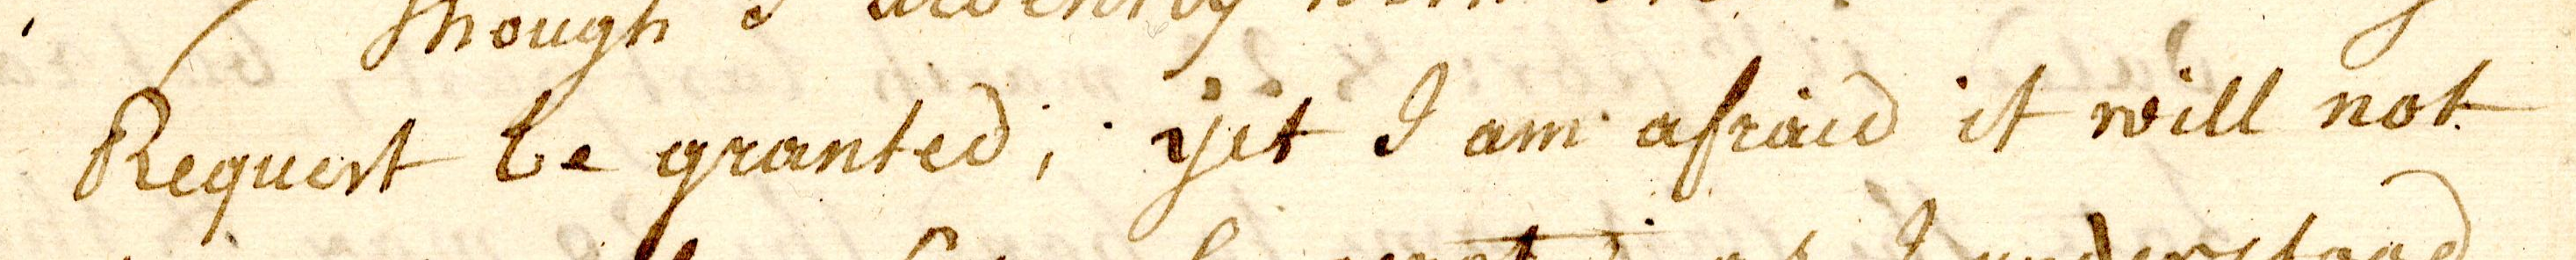Request be granted, yet I am afraid it will not
